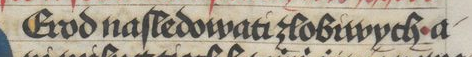Erod naſledowati zlobiwych.a¬
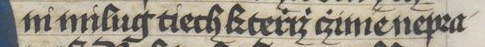ni milug tiech kteṙiż cżiníe nepra¬
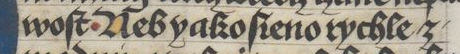woſt.Neb yako ſieno rychle z¬
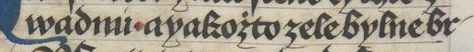wadni.a yakożto zele bylne br¬
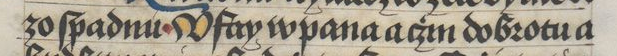zo ſpadnú.Vſay w pana a cżin dobrotu a
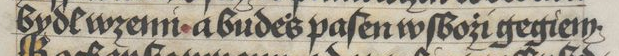bydl wzemi.a budeṡ paſen w ſbożí gegiem.
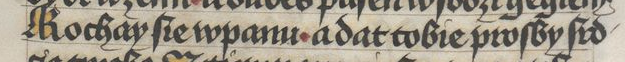Kochay ſie wpanu.a dat tobie proſby ſrd¬
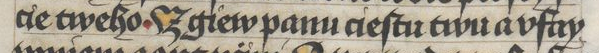cie tweho.Zgiew panu cieſtu twu a vſay
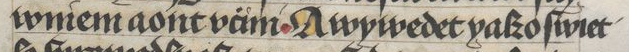wniem aont vċiní.A wywedet yako ſwiet¬
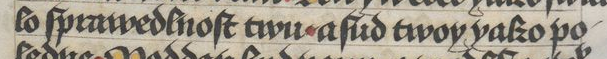lo ſprawedlnoſt twu.a ſud twoy yako po¬
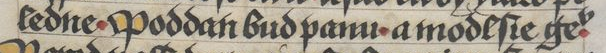ledne.Poddan bud panu.a modlſie gev
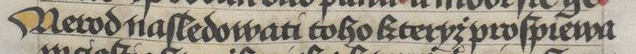Nerod naſledowati toho kteryż proſpiewa
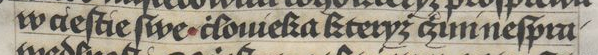w cieſtie ſwe.člouíeka kteryż cżiní neſpra¬
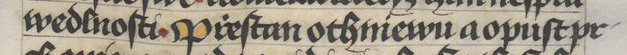wedlnoſti.Pṙeſtan othniewu a opuſt pr¬
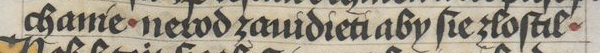chaníe.nerod zauidieti aby ſie zloſtil.
